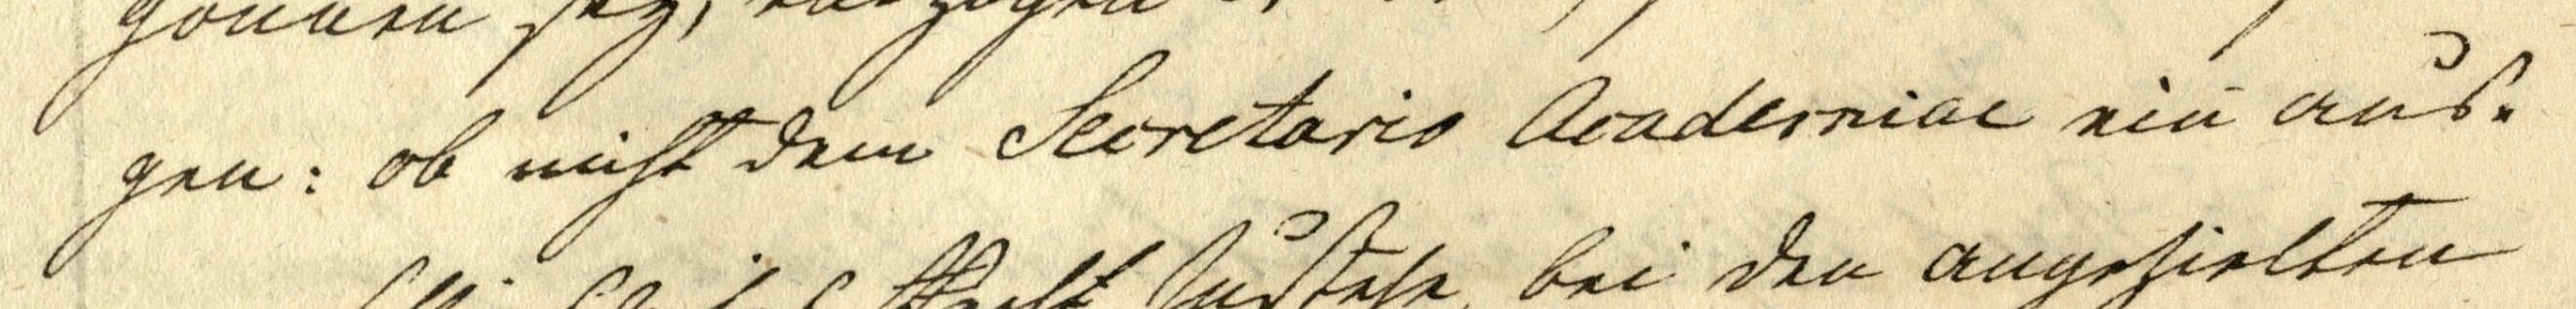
gen: ob nicht dem Secretario Academiae ein aus¬
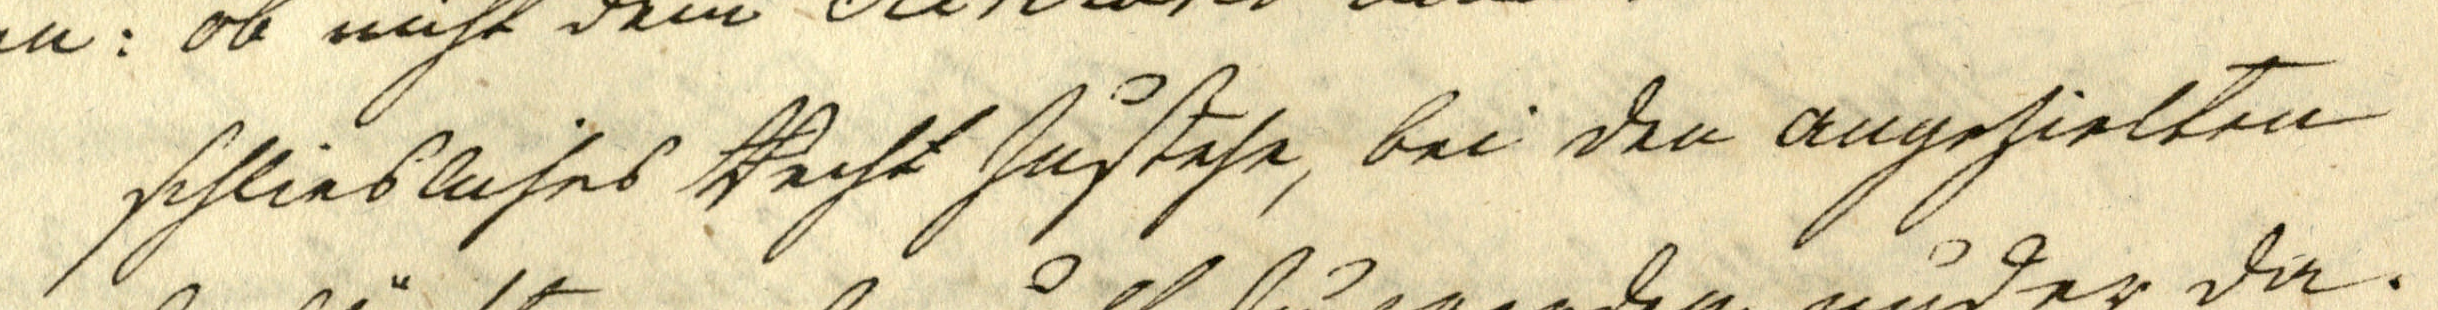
schliesliches Recht zustehe, bei den angezielten
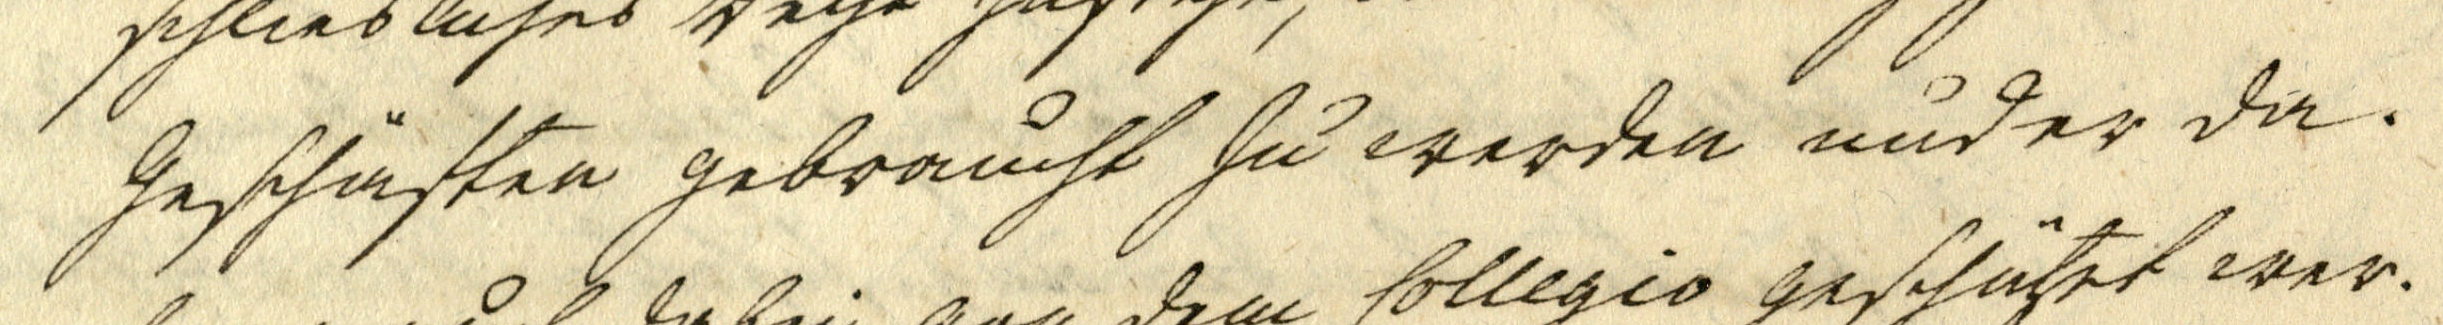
Geschäften gebraucht zu werden und er da¬
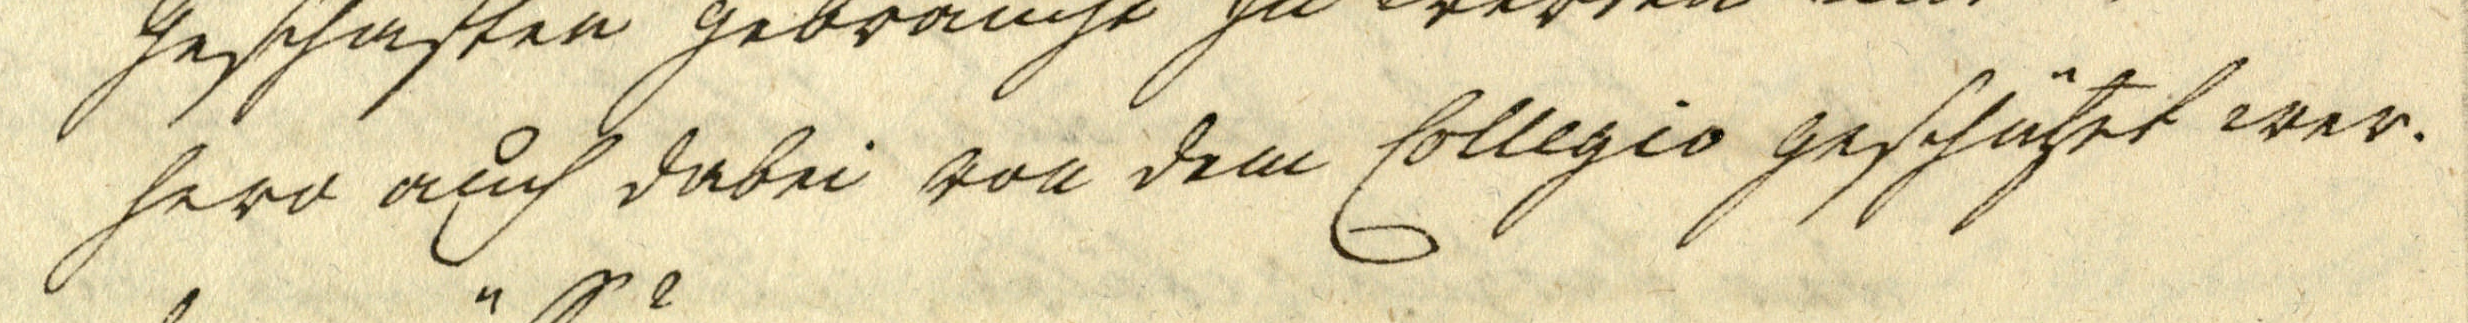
hero auch dabei von dem Collegio geschützet wer¬
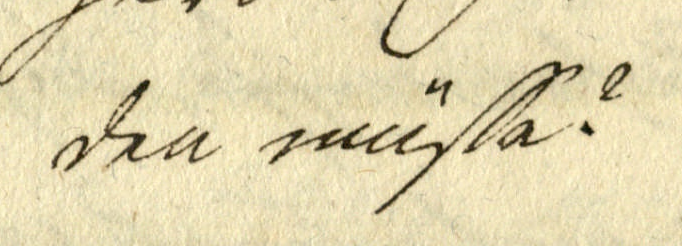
den müsse?
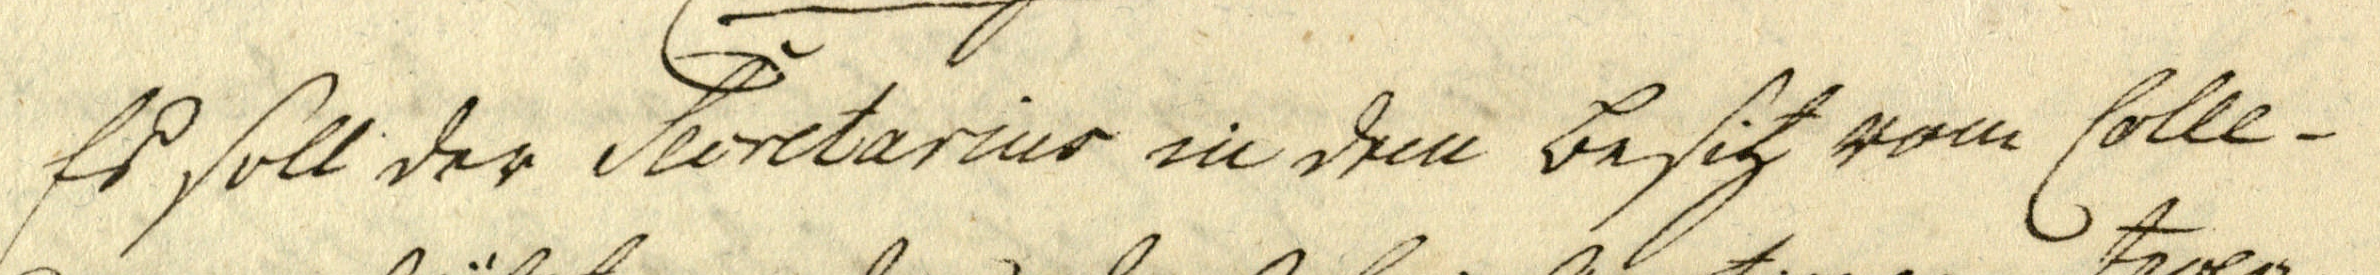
Es soll der Secretarius in dem Besitz vom Colle¬
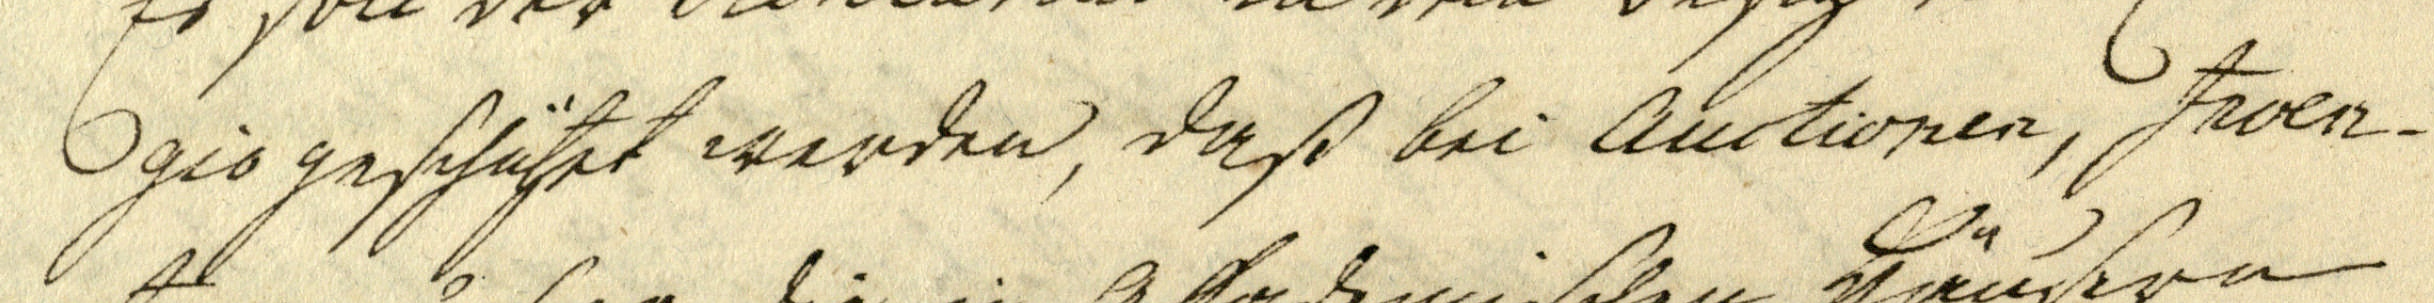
gio geschützet werden, daß bei Auctionen, Inven¬
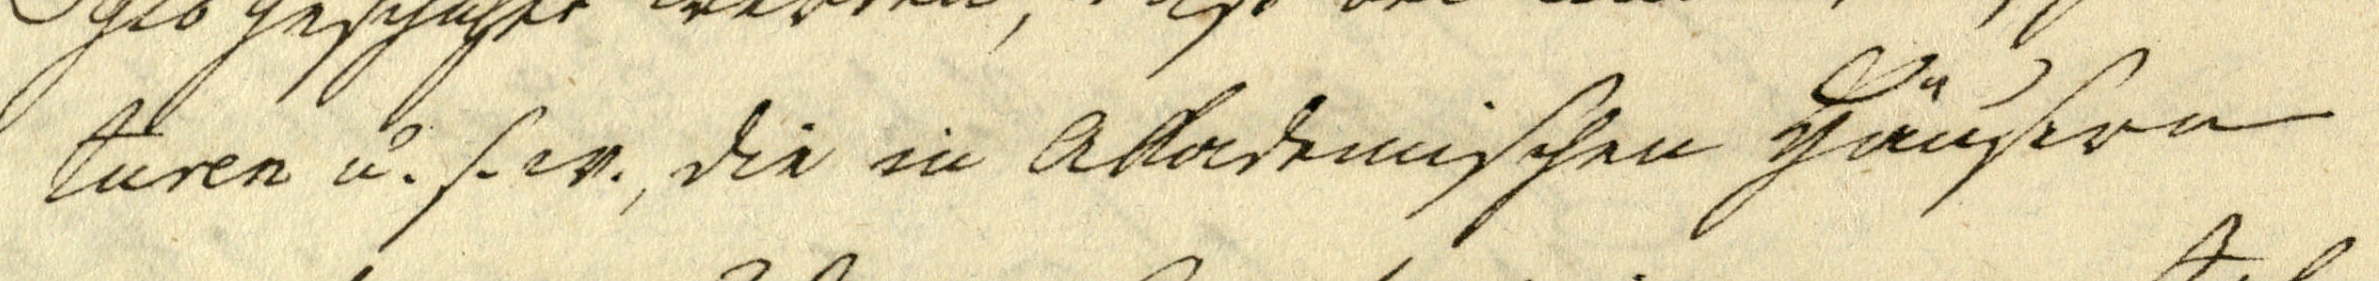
turen u. s. w., die in Akademischen Häusern
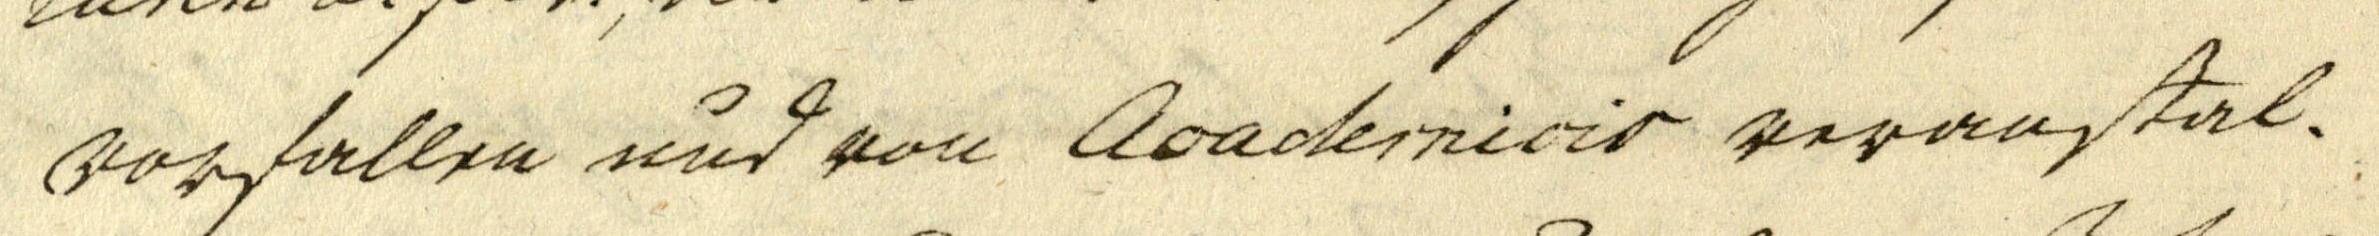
vorfallen und von Academicis veranstal¬
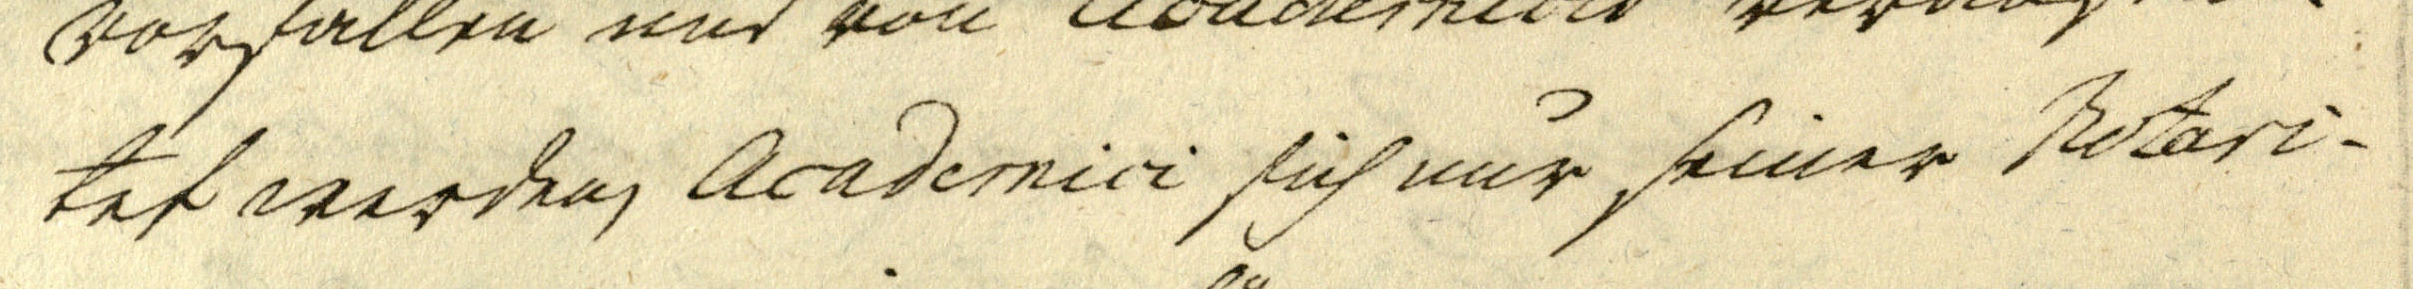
tet werden, Academici sich nur seiner Notari¬
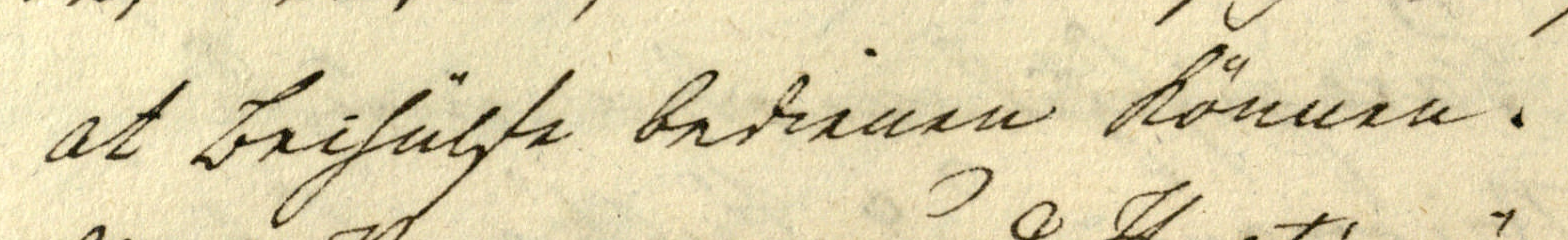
at Beihülfe bedienen können.
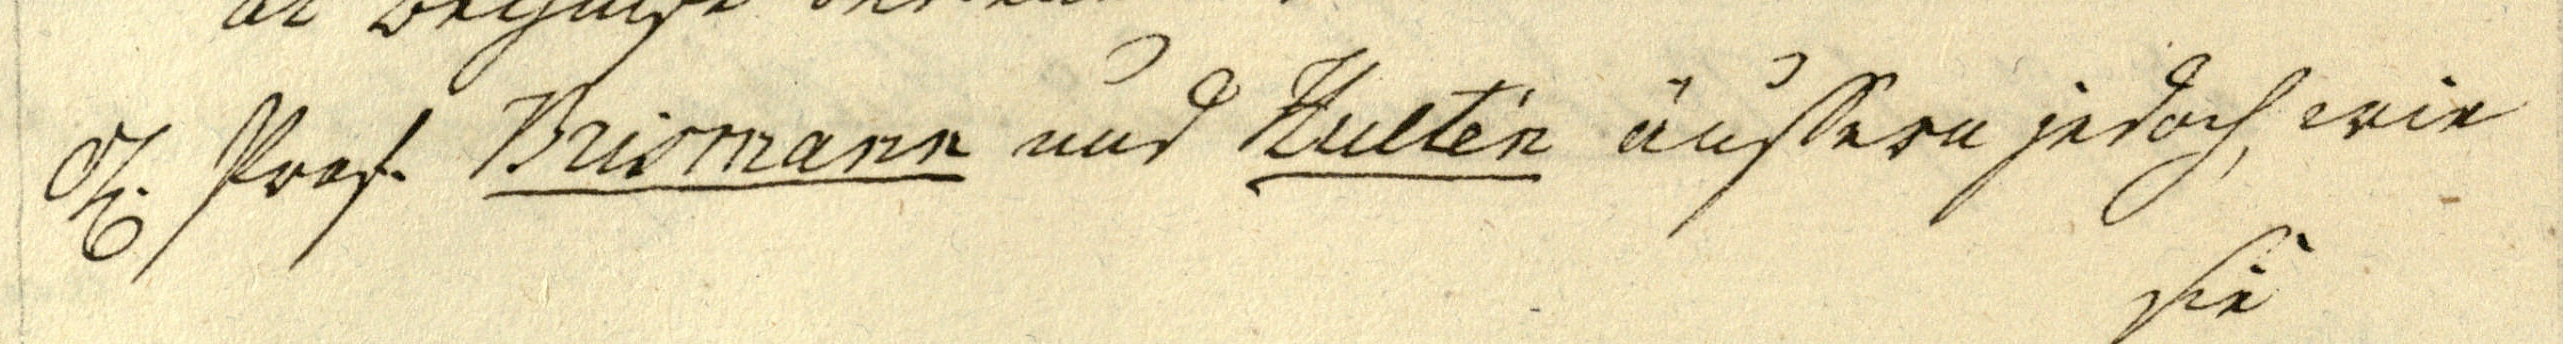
dh. Prof. Brismann und Hultén äussern jedoch, wie
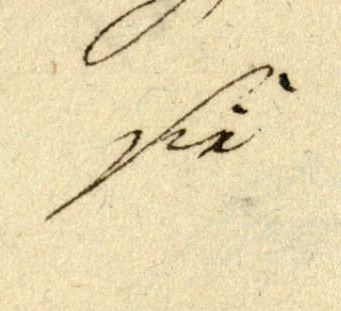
sie
